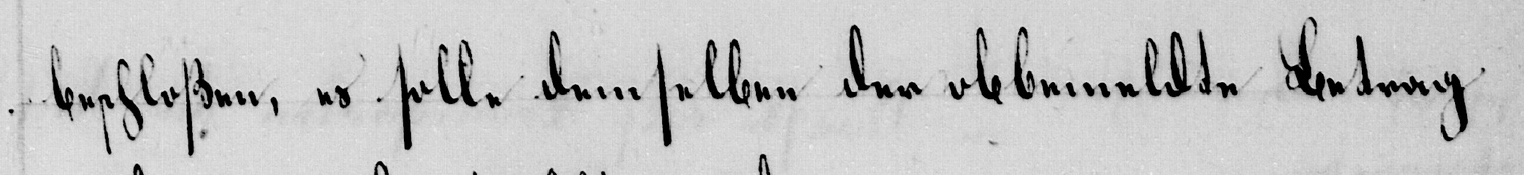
beschloßen, es solle demselben der obbemeldete Betrag
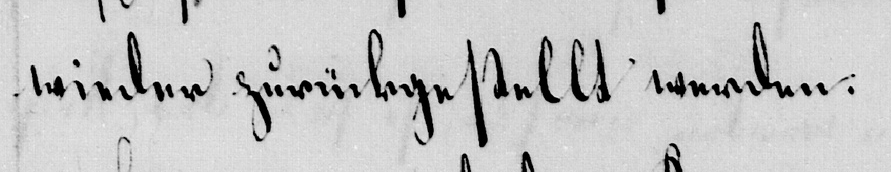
wieder zurückgestellt werden.
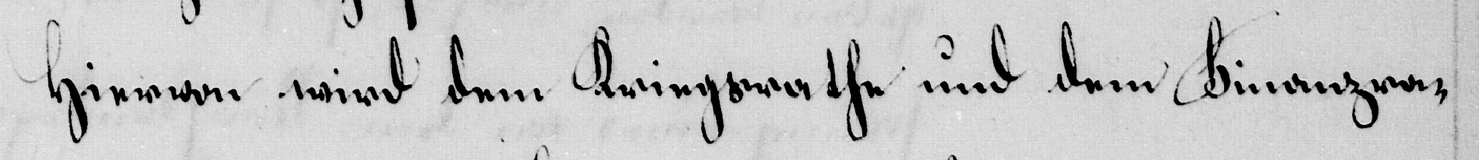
Hiervon wird dem Kriegsrathe und dem Finanzra¬
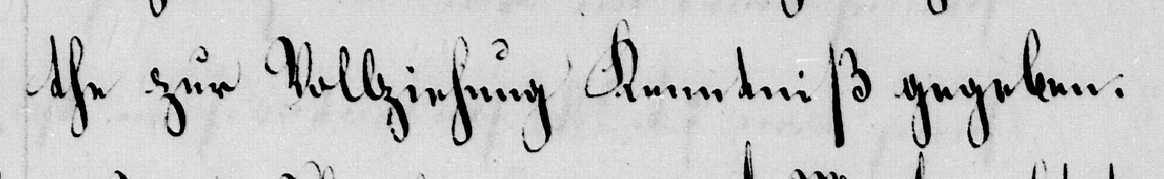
the zur Vollziehung Kenntniß gegeben.
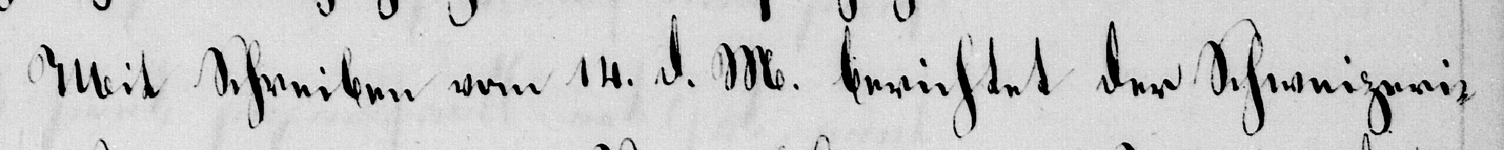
Mit Schreiben vom 14. d. M. berichtete der Schweizeri¬
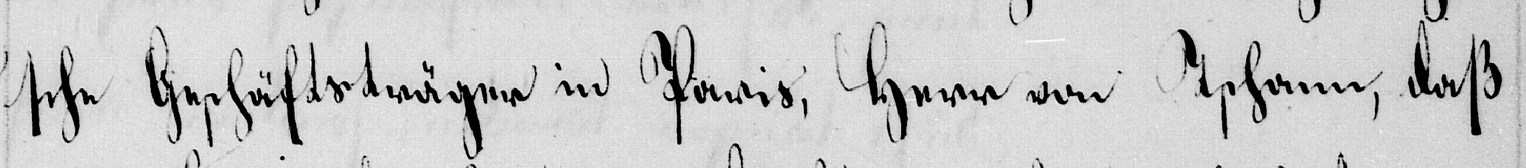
sche Geschäftsträger in Paris, Herr von Tschann, daß
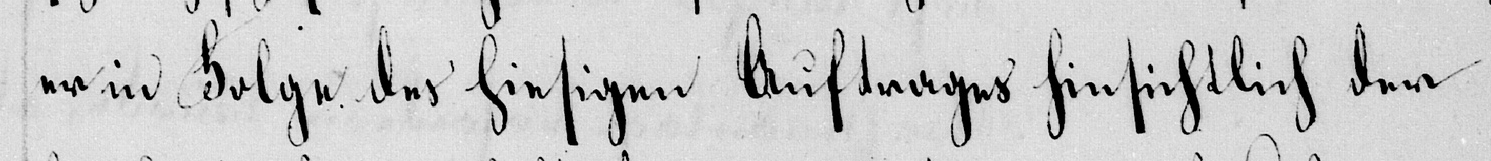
er in Folge des hiesigen Auftrages hinsichtlich der
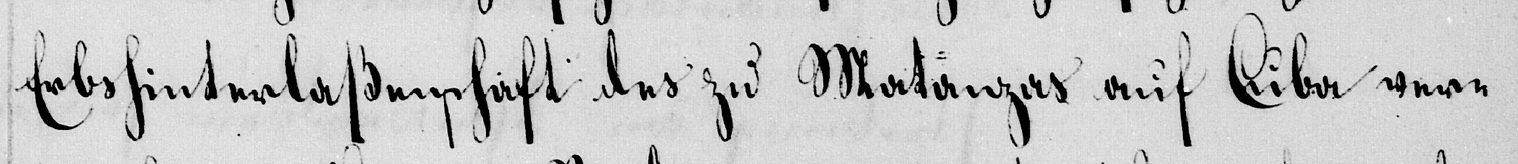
Erbshinterlaßenschaft des zu Matanzas auf Cuba ver¬
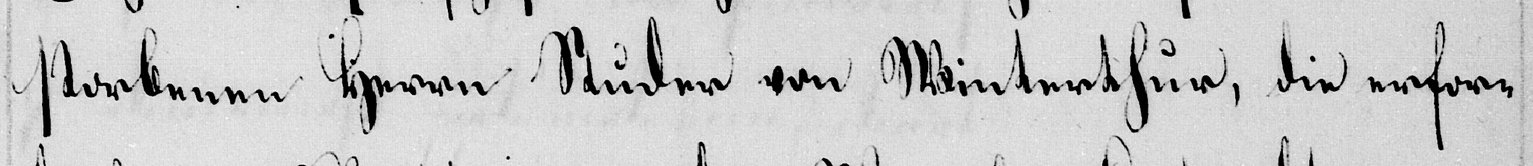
storbenen Herrn Studer von Winterthur, die erfor¬
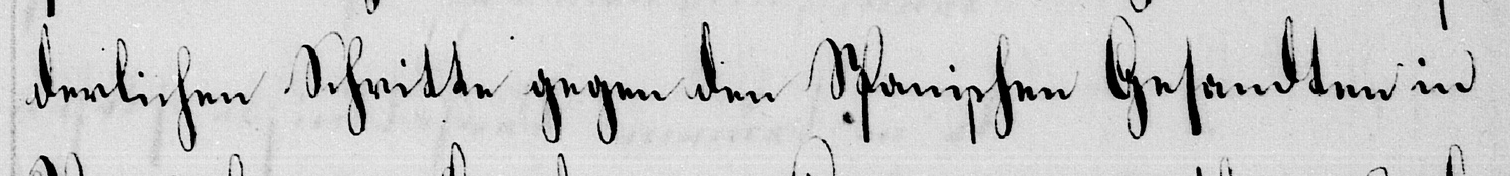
derlichen Schritte gegen den Spanischen Gesandten in
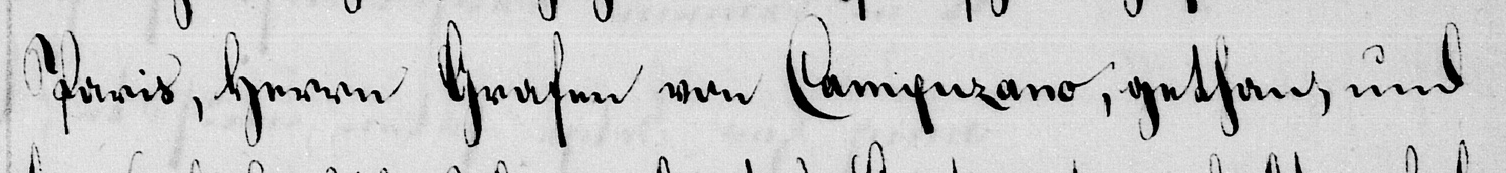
Paris, Herr Grafen von Campuzano, gethan, und
